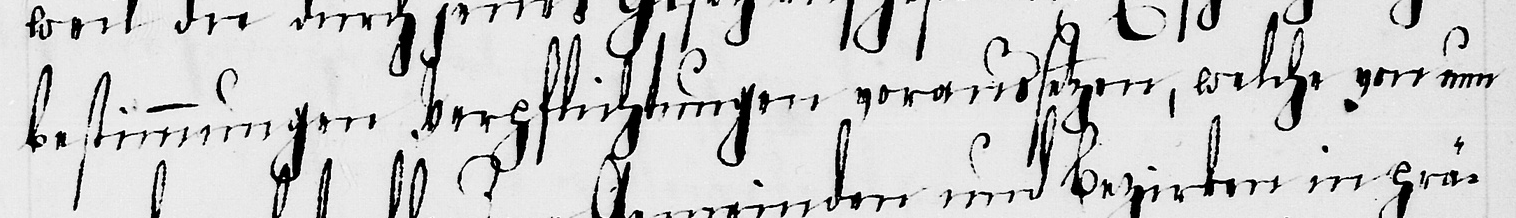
bestimmungen Verpflichtungen voraussetzen, welche von nun
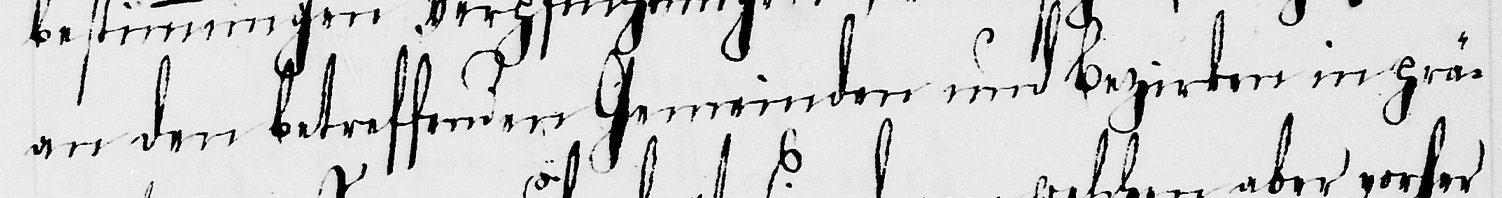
an den betreffenden Gemeinden und Bezirken in prä¬
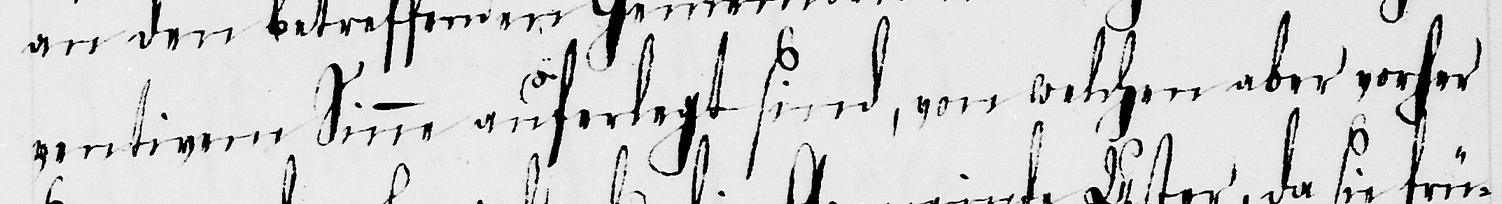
ventivem Sinne auferlegt sind, von welchen aber vorher
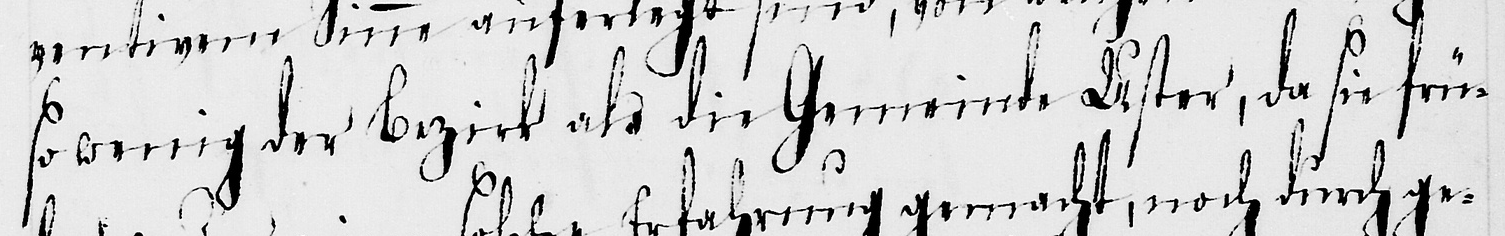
so wenig der Bezirk als die Gemeinde Uster, da sie frü¬
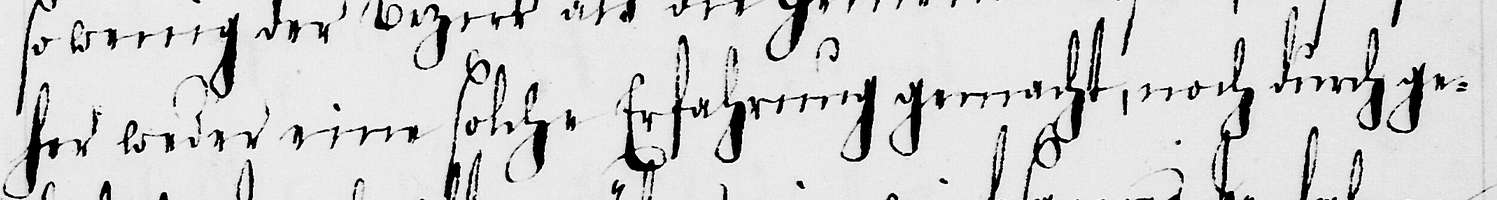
her weder eine solche Erfahrung gemacht, noch durch ge¬
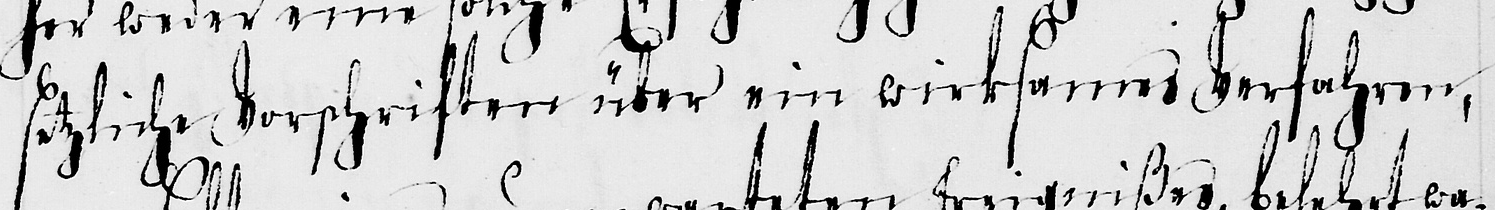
setzliche Vorschriften über ein wirksames Verfahren,
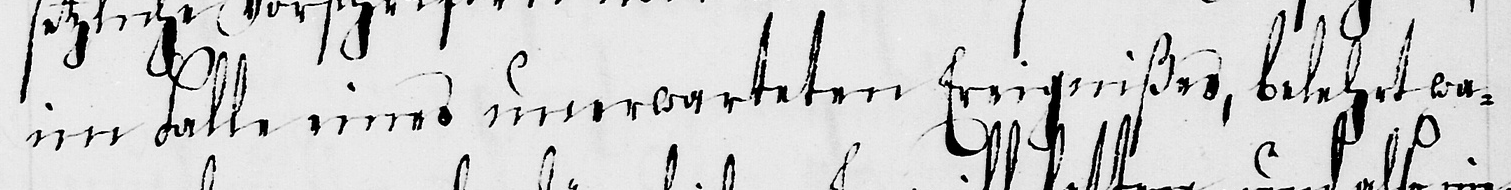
im Falle eines unerwarteten Ereignißes, belehrt war¬
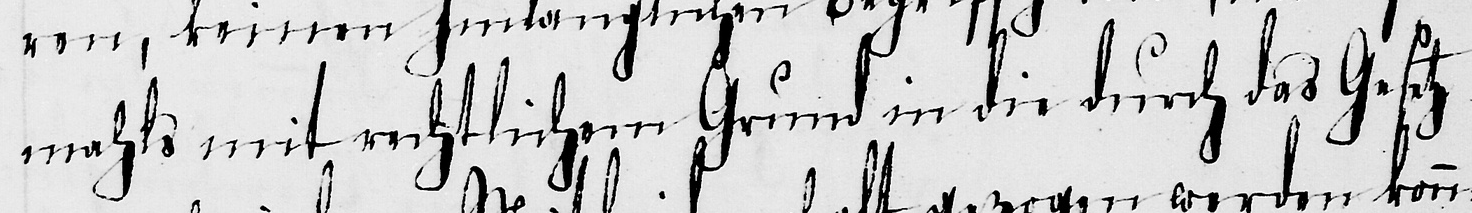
mahls mit rechtlichem Grund in die durch das Gesetz
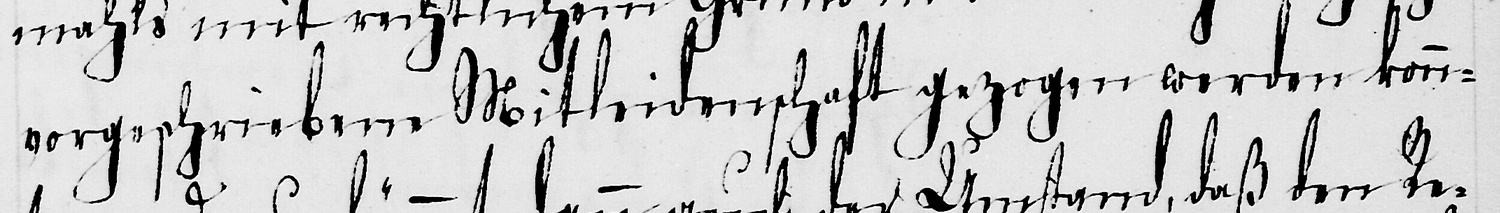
vorgeschriebene Mitleidenschaft gezogen werden könn¬
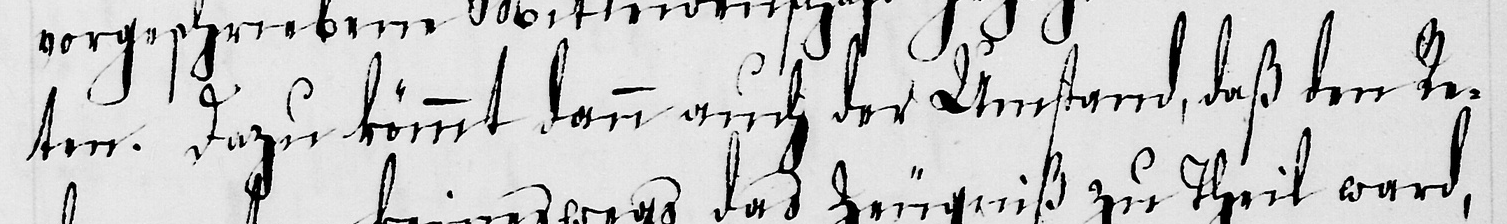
ten. Dazu kömmt dann auch der Umstand, daß den Re¬
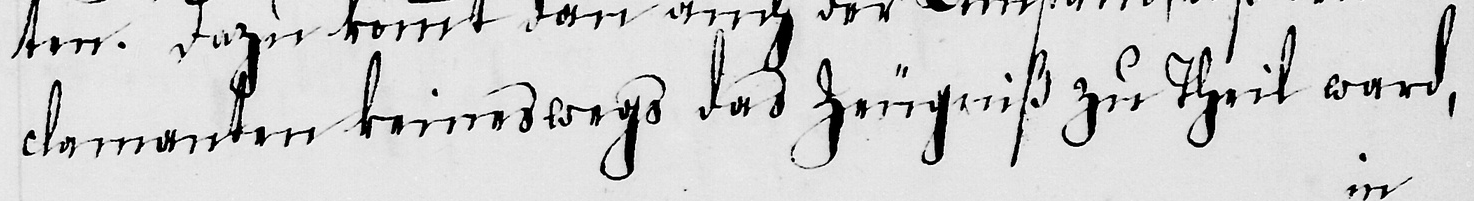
clamanten keineswegs das Zeugniß zu Theil ward,
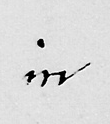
nie¬
